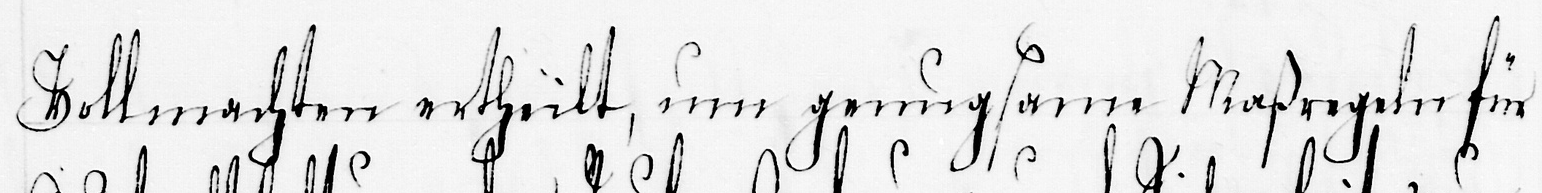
Vollmachten ertheilt, um genugsame Maßregeln für
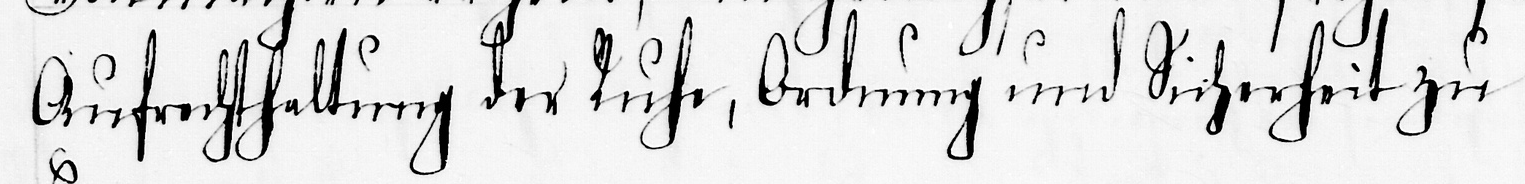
Aufrechthaltung der Ruhe, Ordnung und Sicherheit zu
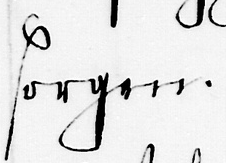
sorgen.
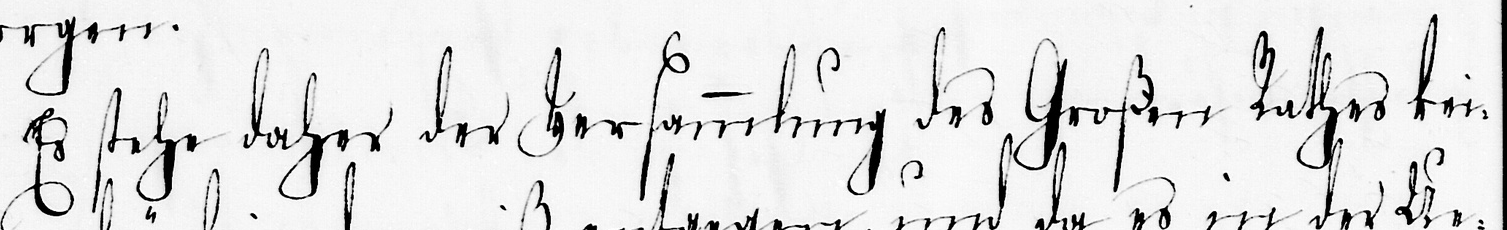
Es stehe daher der Versammlung des Großen Rathes kei¬
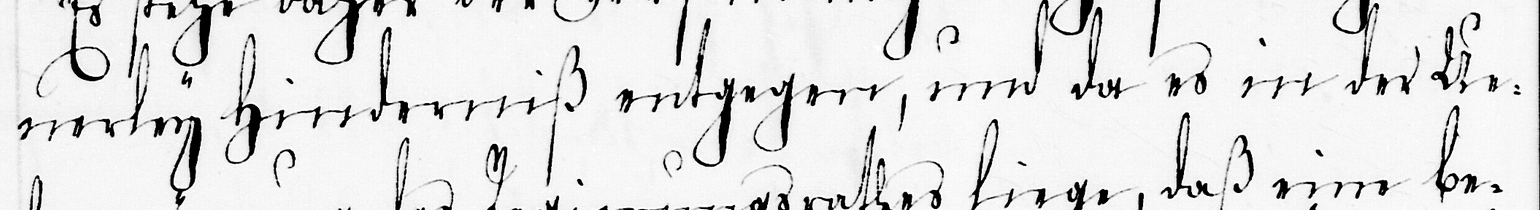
nerley Hinderniß entgegen, und da es in der Ue¬
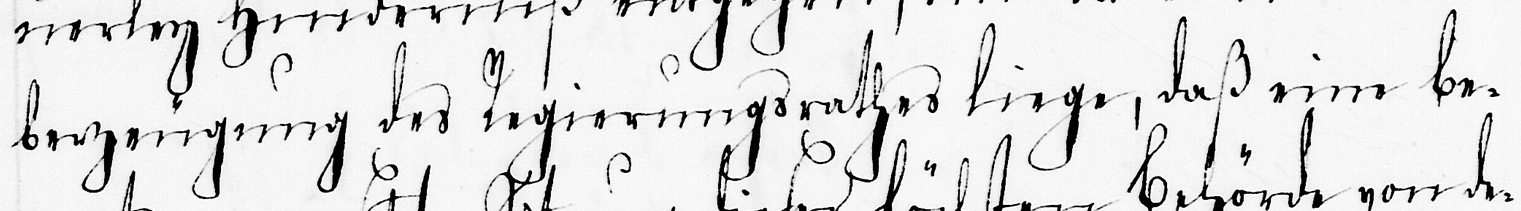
berzeugung des Regierungsrathes liege, daß eine be¬
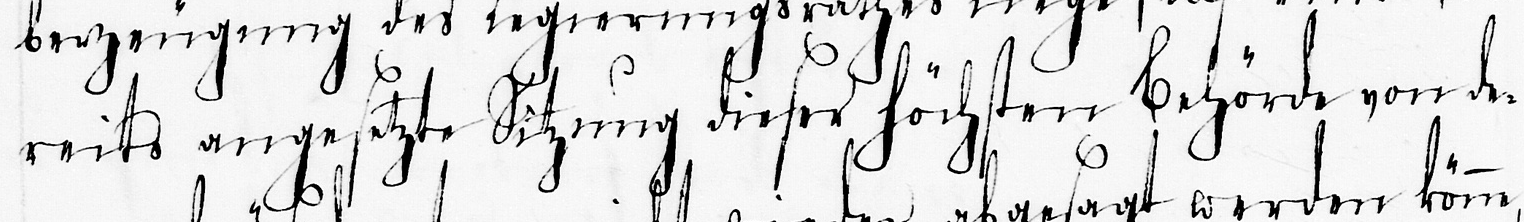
reits angesetzte Sitzung dieser Höchsten Behörde von de¬
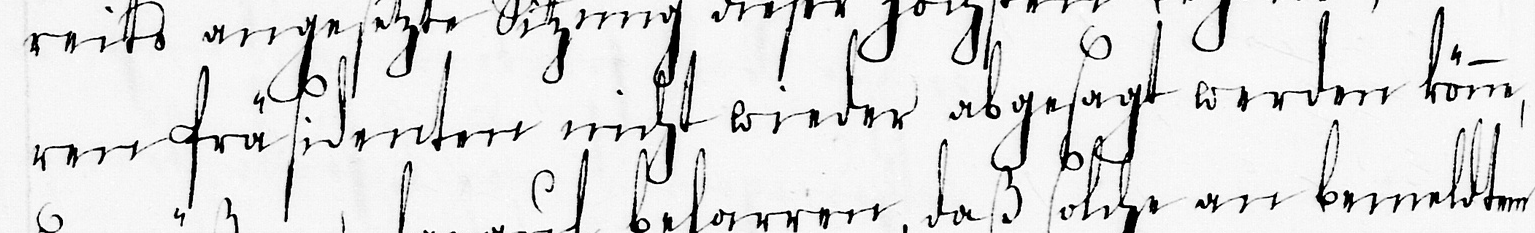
ren Präsidenten nicht wieder abgesagt werden könne,
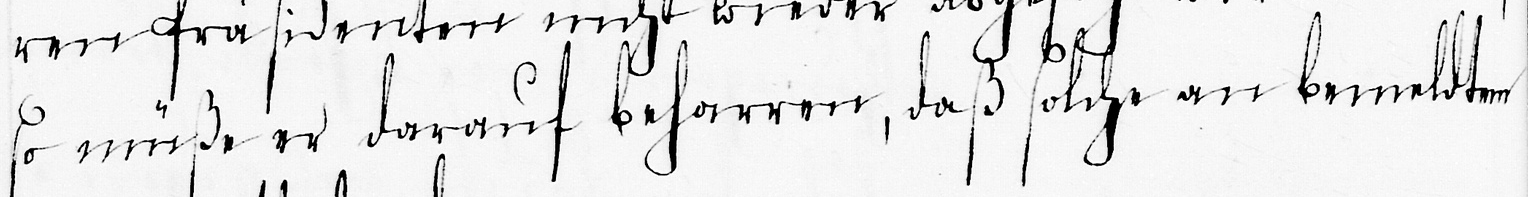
so müße er darauf beharren, daß solche an bemeldtem
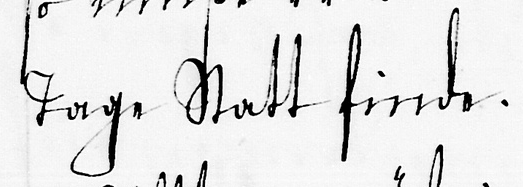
Tage Statt finde.
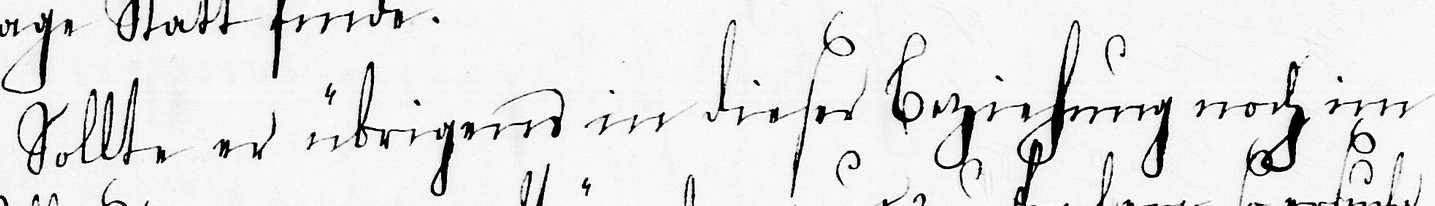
Sollte er übrigens in dieser Beziehung noch im
